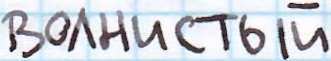волнистый
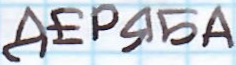деряба
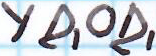удод
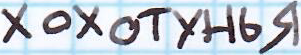хохотунья
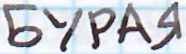бурая
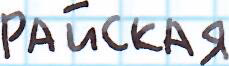райская
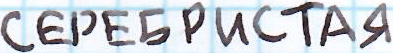серебристая
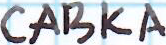савка
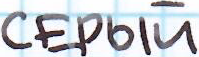серый
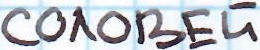соловей
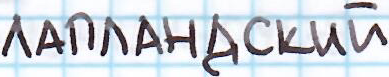лапландский
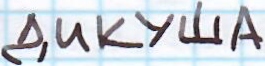дикуша
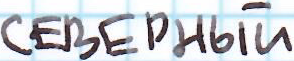северный
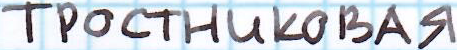тростниковая
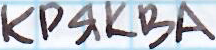кряква
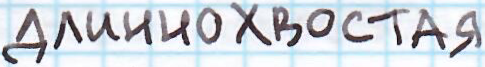длиннохвостая
